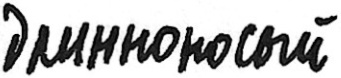длинноносый
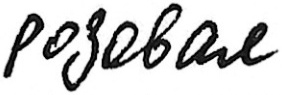розовая
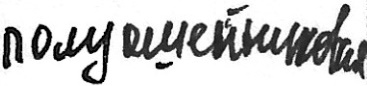полуошейниковая
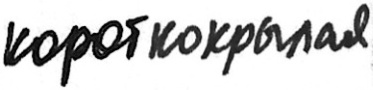короткокрылая
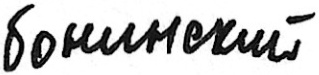бонинский
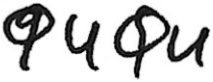фифи
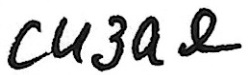сизая
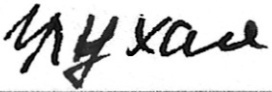глухая
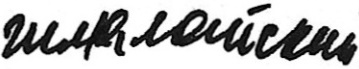гималайскии
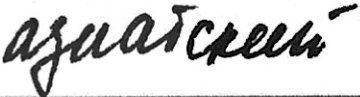азиатский
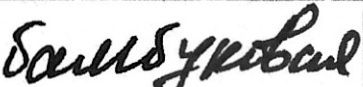бамбуковая
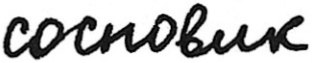сосновик
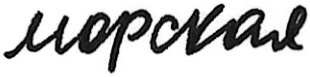морская
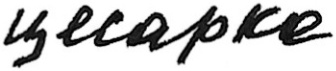цесарка
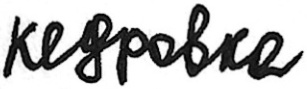кедровка
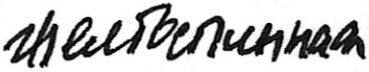желтоспинная
